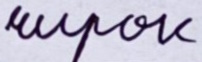чирок
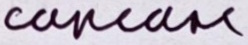сапсан
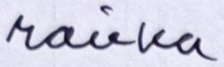чайка
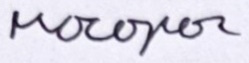носорог
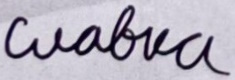славка
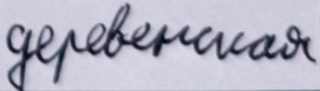деревенская
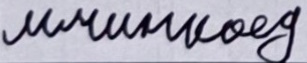личинкоед
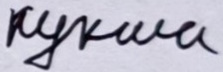кукша
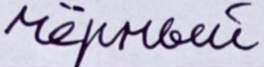чёрный
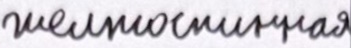желтоспинная
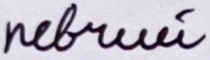певчий
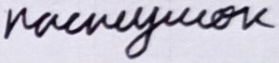пастушок
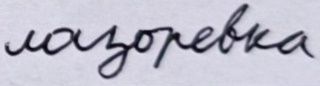лазоревка
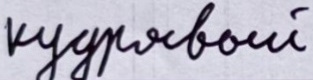кудрявый
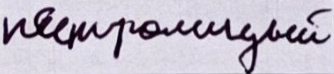пестролицый
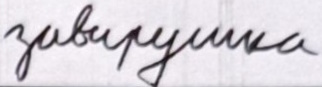завирушка
